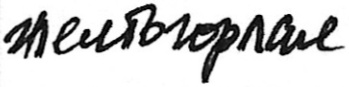желтогорлая
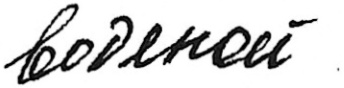водяной
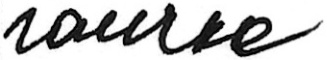гаичка
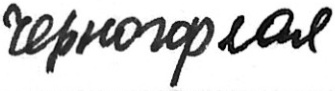черногорлая
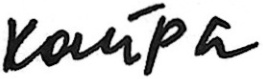кайра
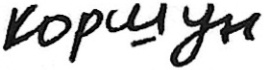коршун
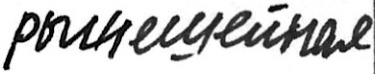рыжешейная
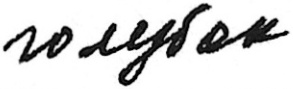голубок
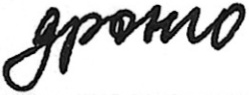дронго
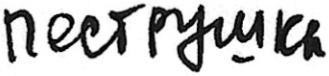пеструшка
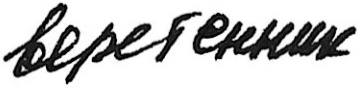веретенник
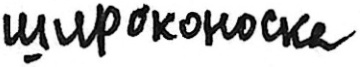широконоска
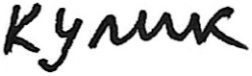кулик
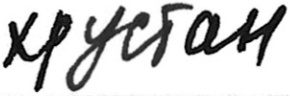хрустан
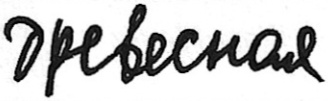древесная
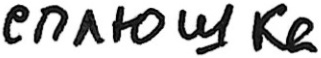сплюшка
